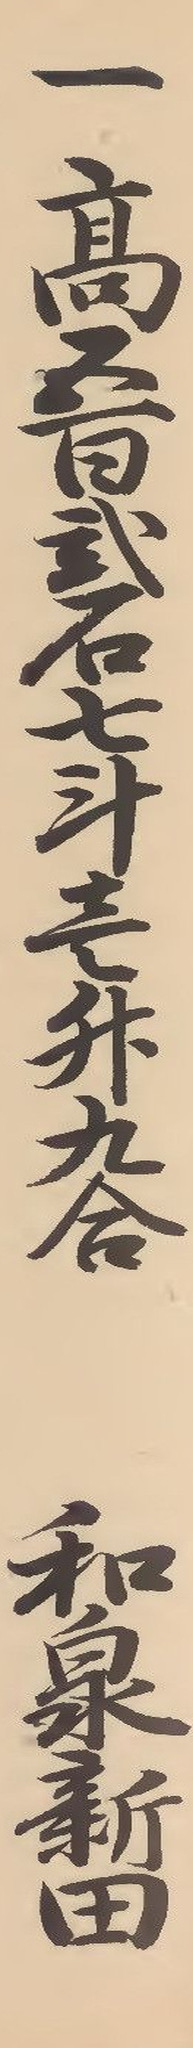一高五百弐石七斗壱升九合和泉新田
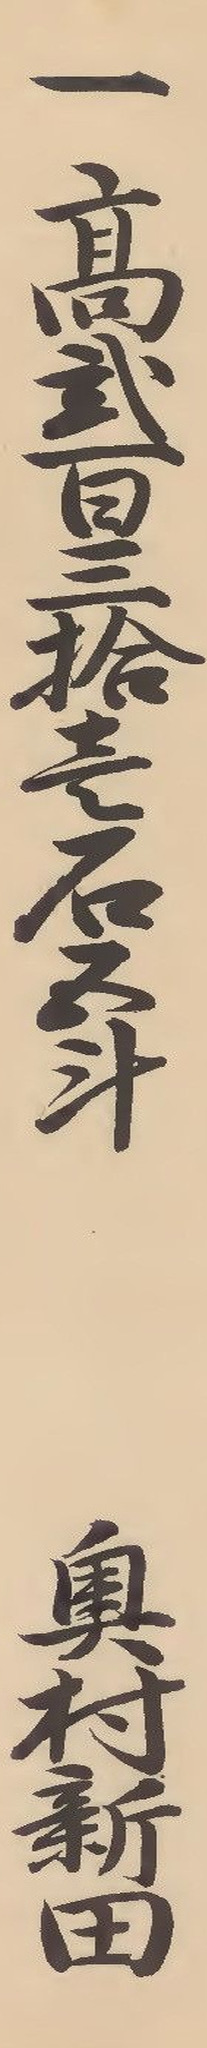一高弐百三拾壱石五斗奥村新田
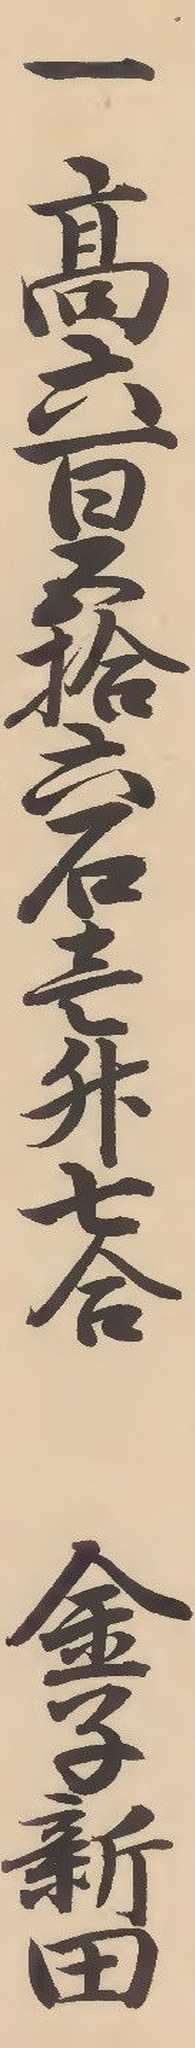一高六百五拾六石壱升七合金子新田
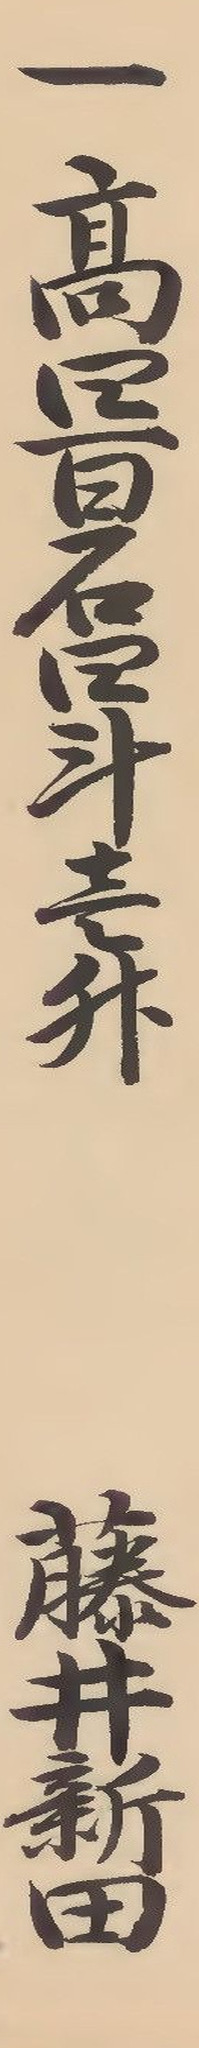一高四百石四斗壱升藤井新田

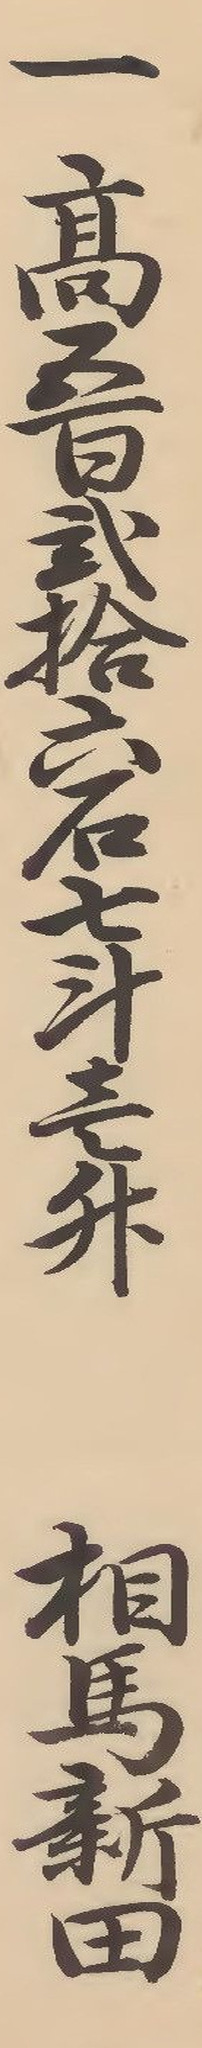一高五百弐拾六石七斗壱升相馬新田
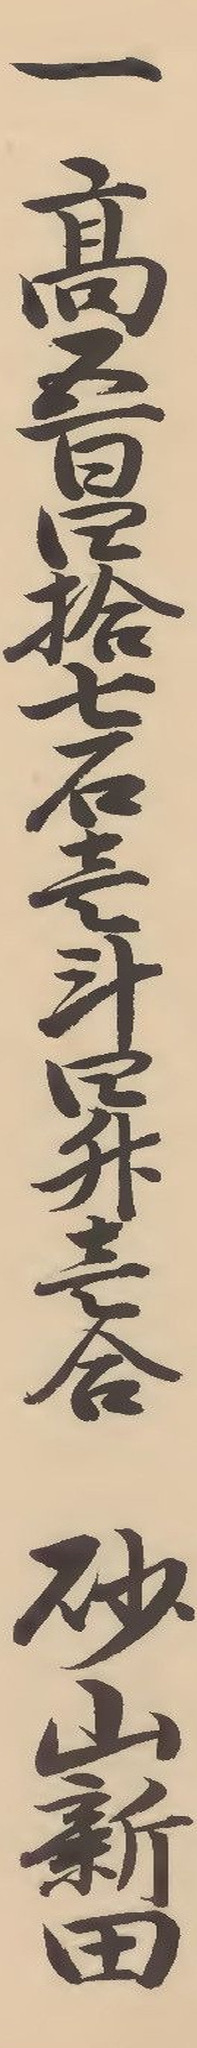一高五百四拾七石壱斗四升壱合砂山新田
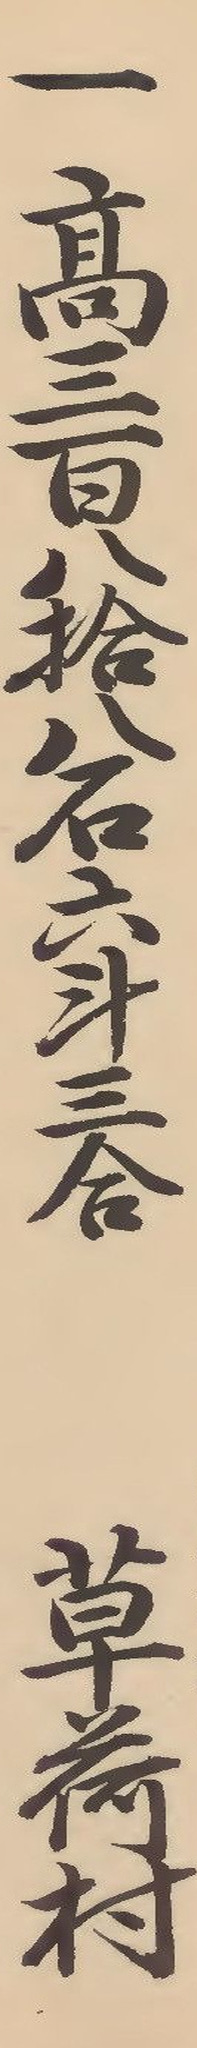一高三百八拾八石六斗三合草荷村
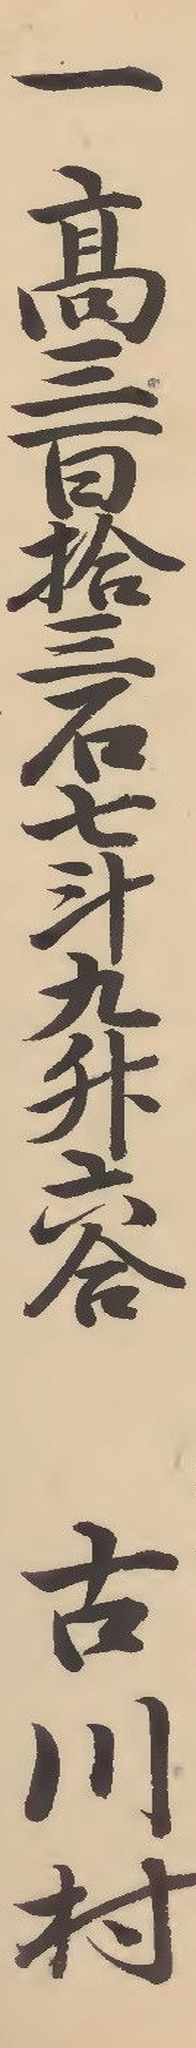一高三百拾三石七斗九升六合古川村
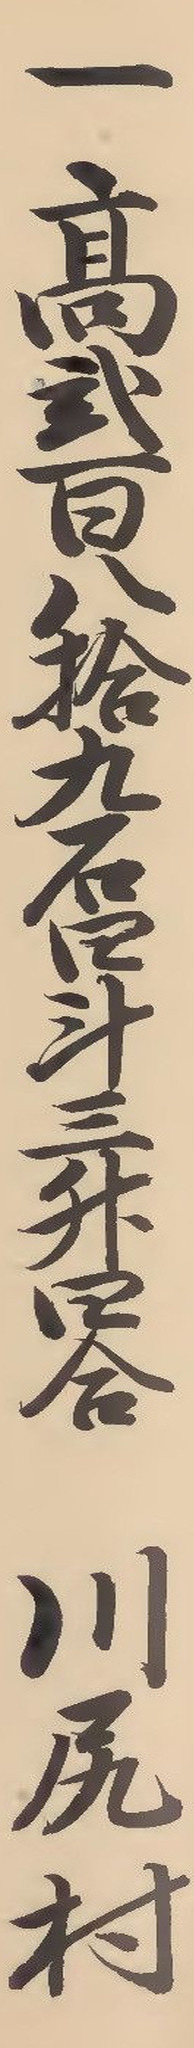一高弐百八拾九石四斗三升四合川尻村
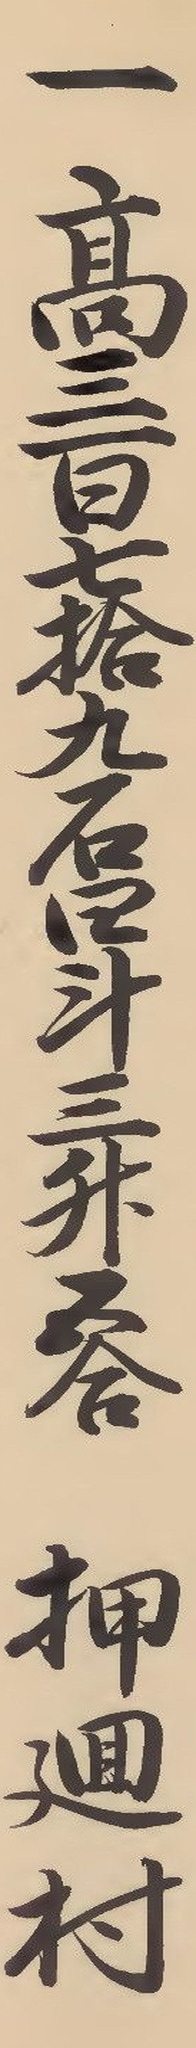一高三百七拾九石四斗三升五合押廻村
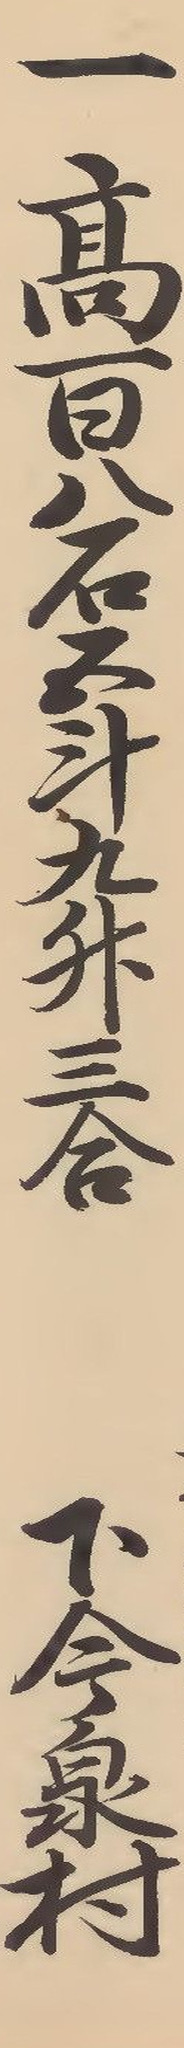一高百八石五斗九升三合下今泉村
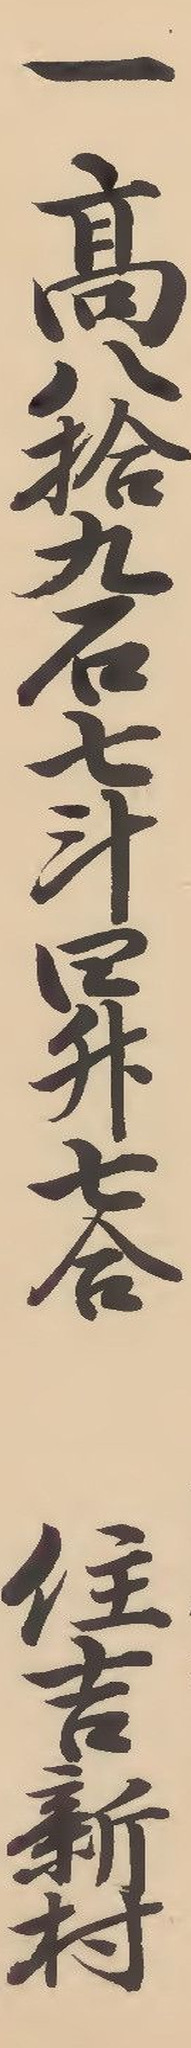一高八拾九石七斗四升七合住吉新村

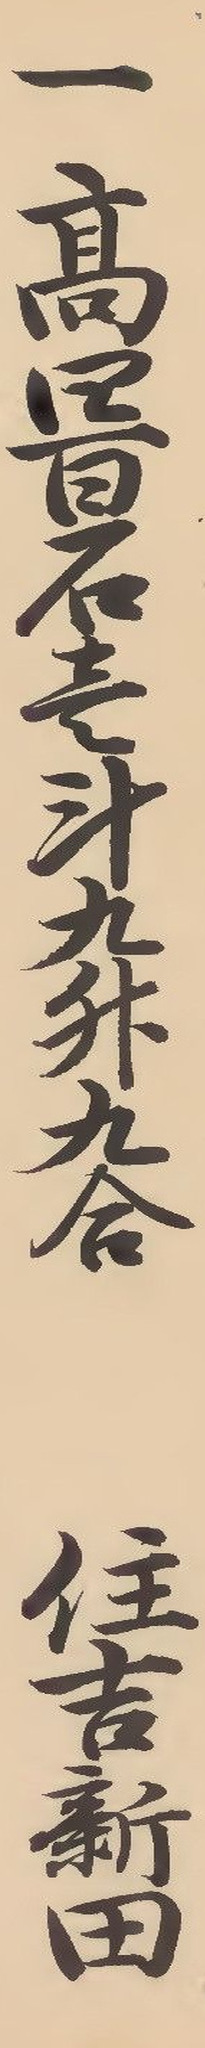一高四百石壱斗九升九合住吉新田
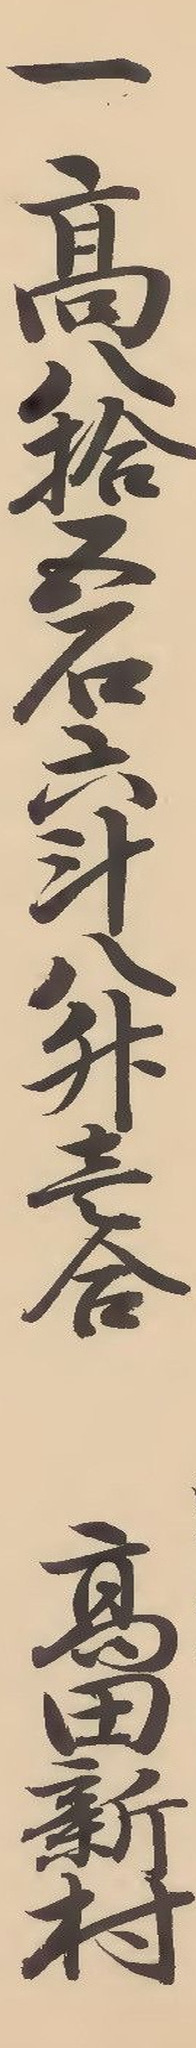一高八拾五石六斗八升壱合高田新村
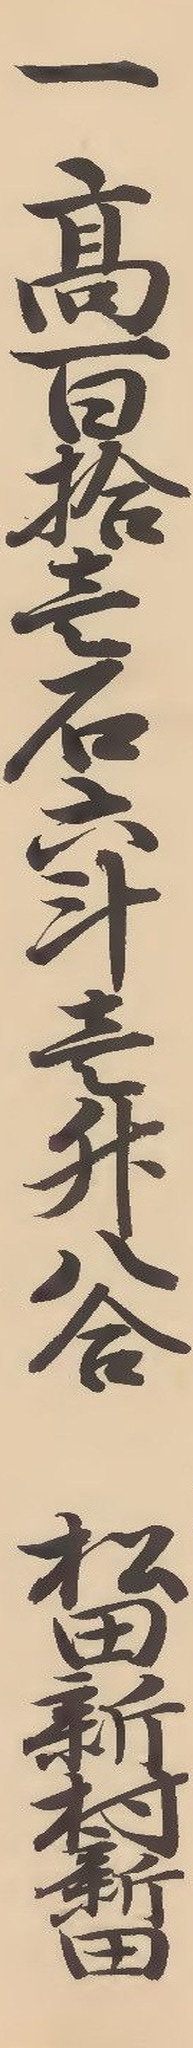一高百拾壱石六斗壱升八合松田新村新田
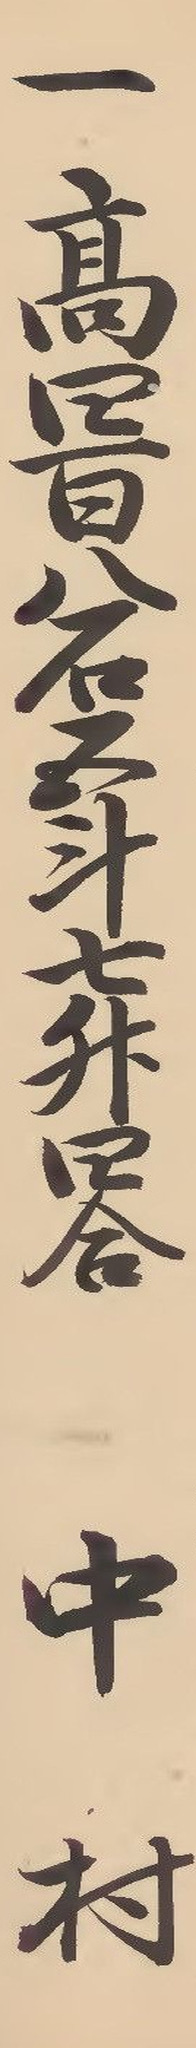一高四百八石五斗七升四合中村
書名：越後国郷帳　下
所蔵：国立公文書館 National Archives of Japan
